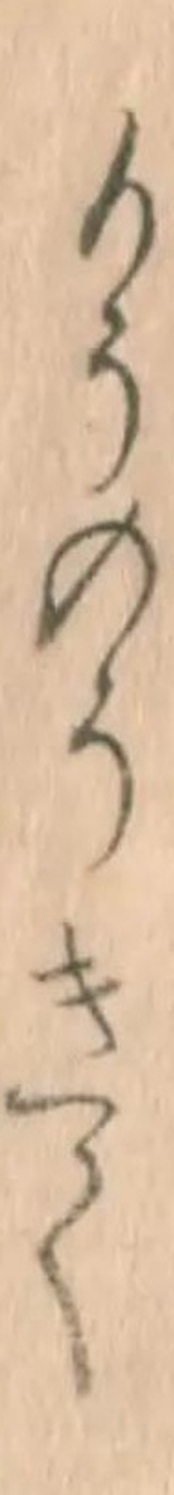りうのうきく
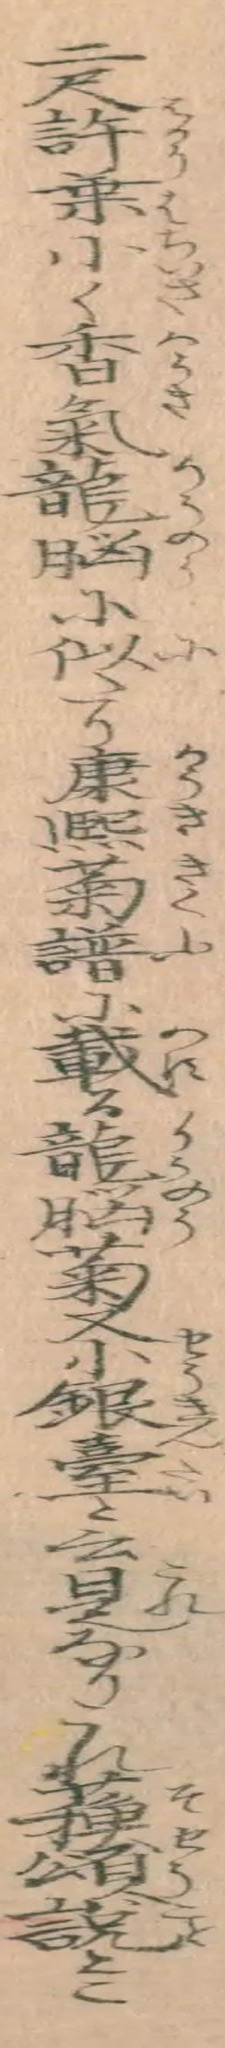二尺許葉小く香気龍脳に似たり康熙菊譜に載る龍脳菊又小銀台と云是なりこれ蘓頌説こととこ
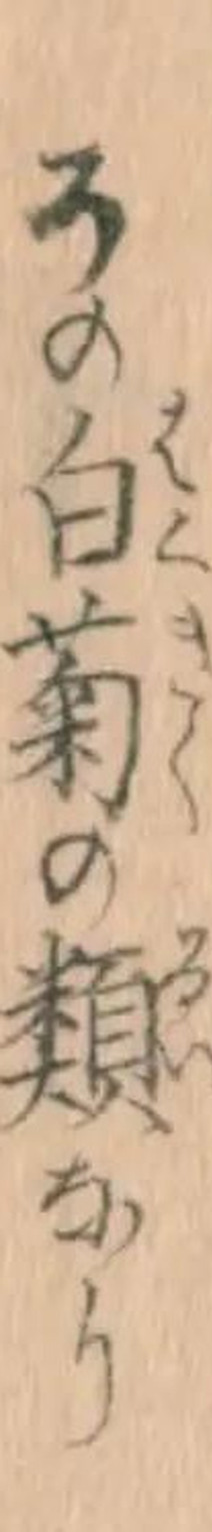ろの白菊の類なり
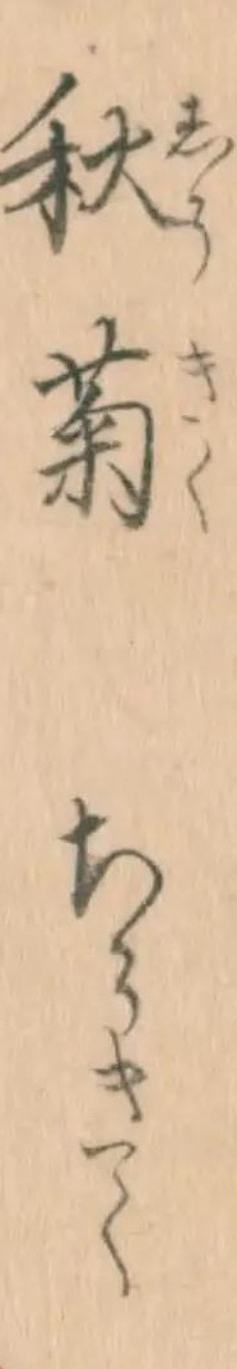秋菊ちうきく
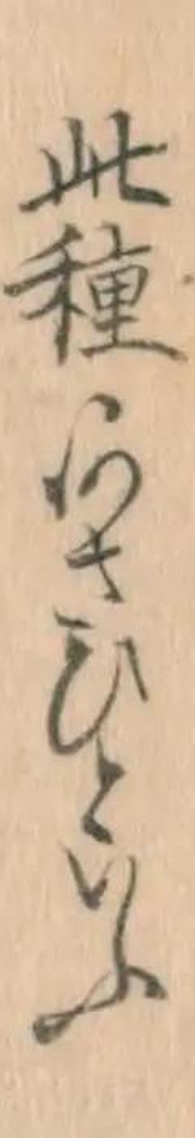此種あさひといふ
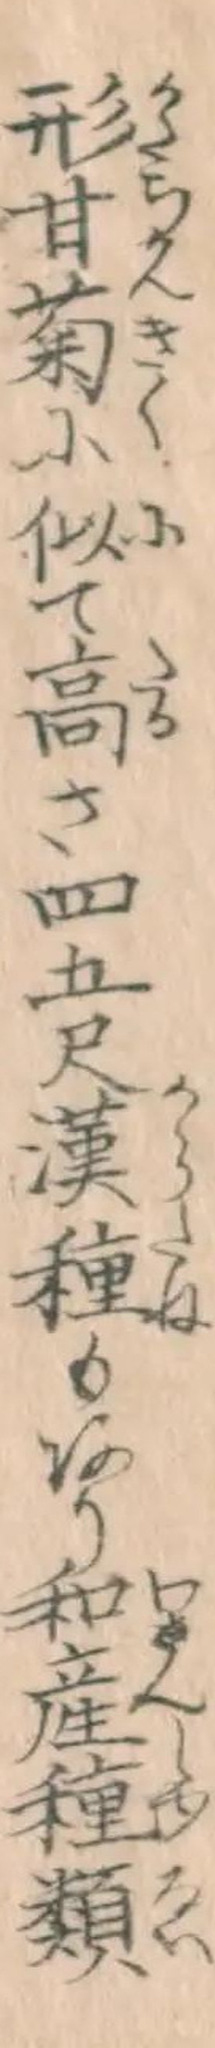形甘菊に似て高さ四五尺漢種もあり和産種類
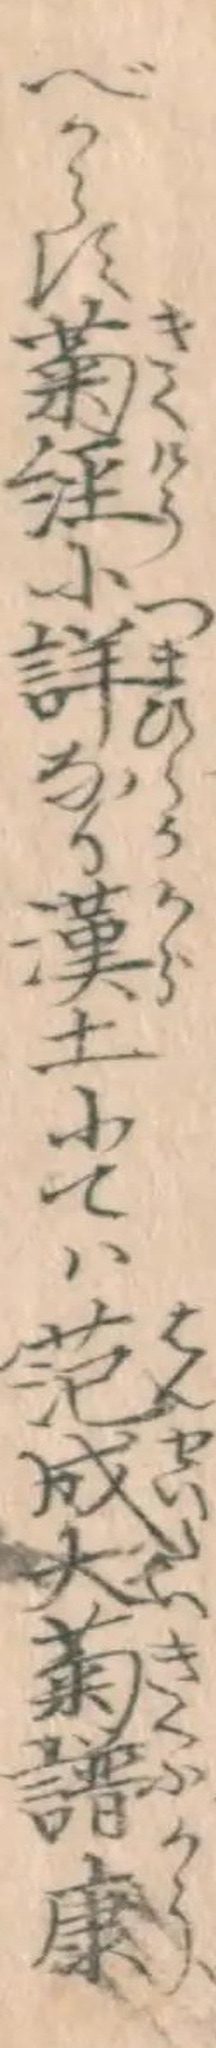べからす菊経に詳なり漢土にては范成大菊譜康
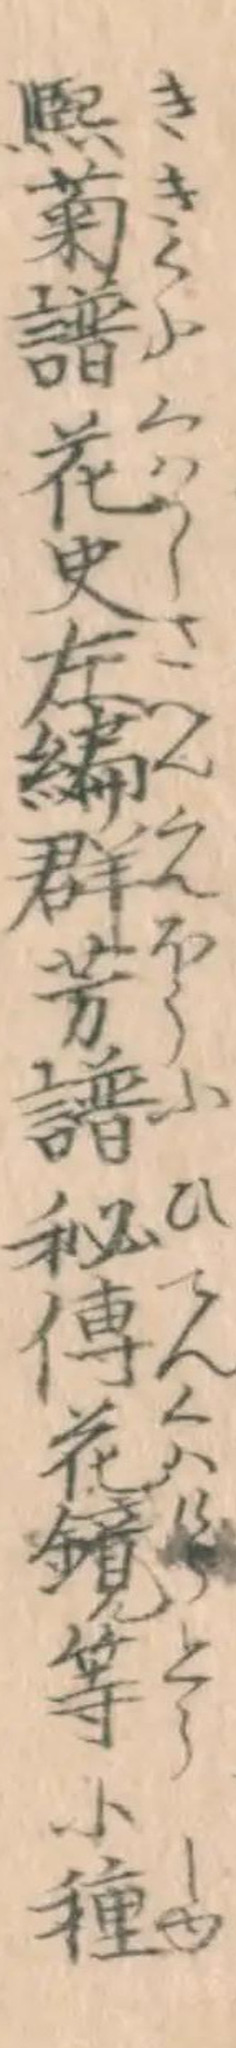熙菊譜花史左編群芳譜秘傳花鏡等に種
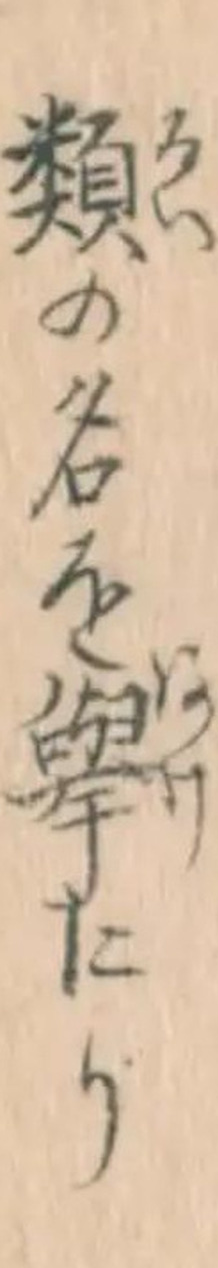類の名を舉たり
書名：本草図譜. 巻13-15
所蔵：国立国会図書館 National Diet Library, JAPAN
